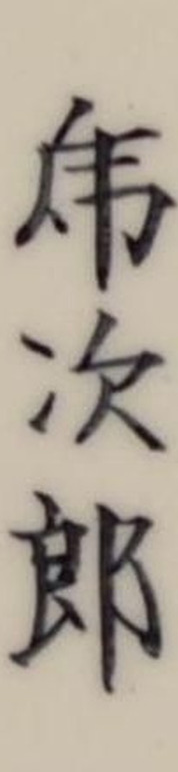乕次郎
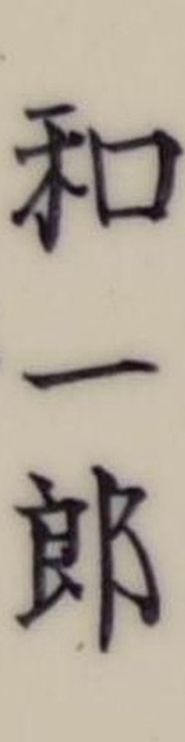和一郎
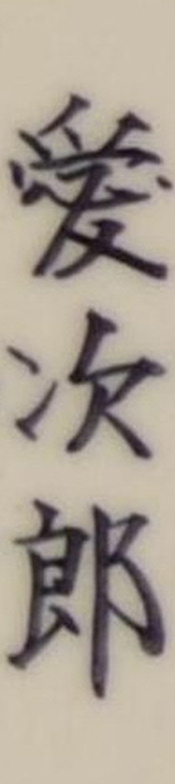愛次郎

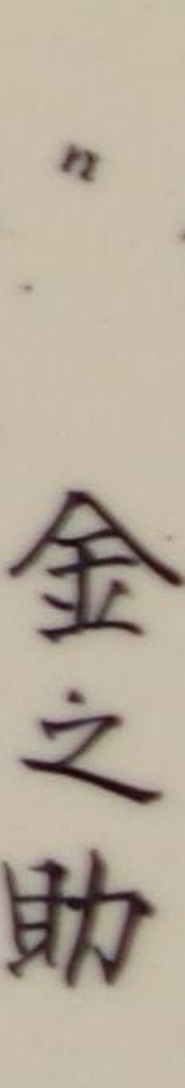金之助
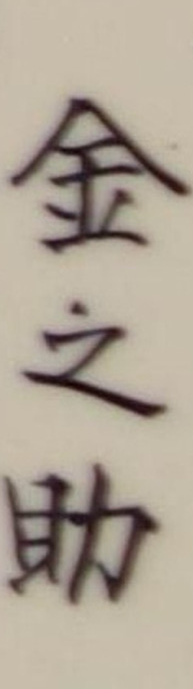金之助
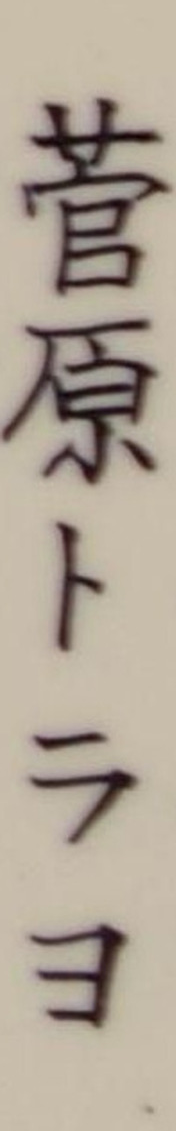菅原トラヨ
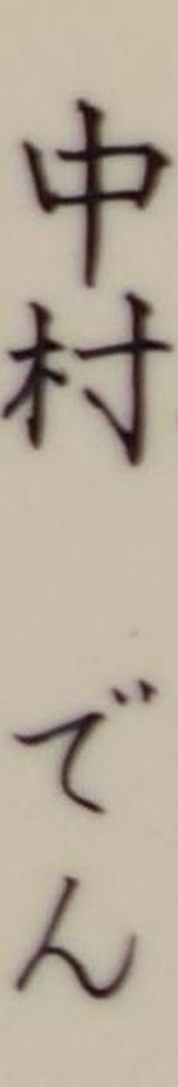中村でん
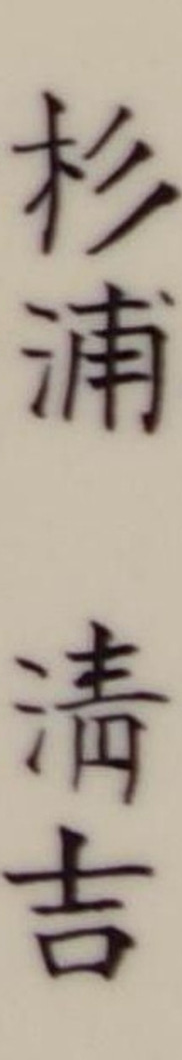杉浦清吉
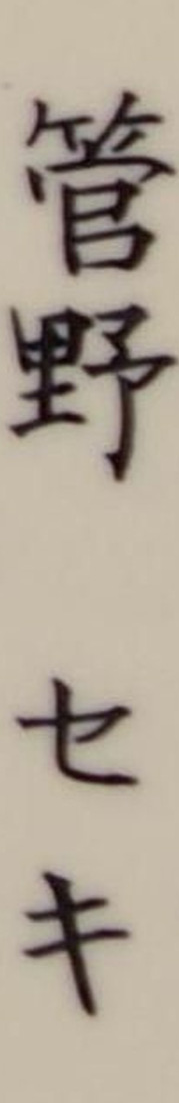管野セキ
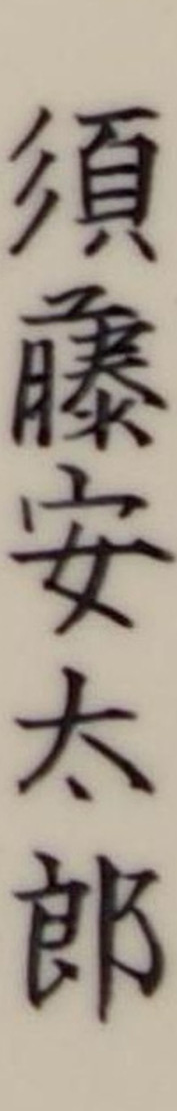須藤安太郎
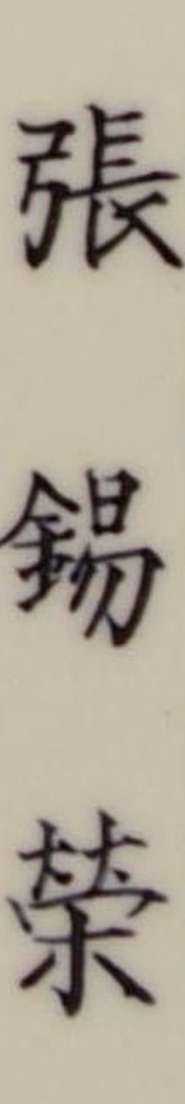張錫榮
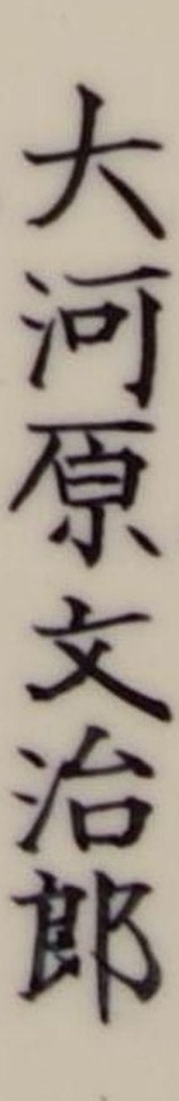大河原文治郎
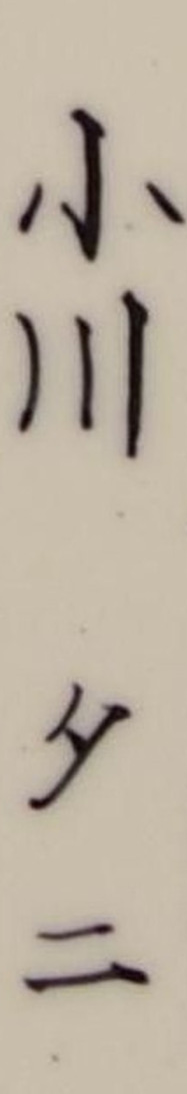小川夕二
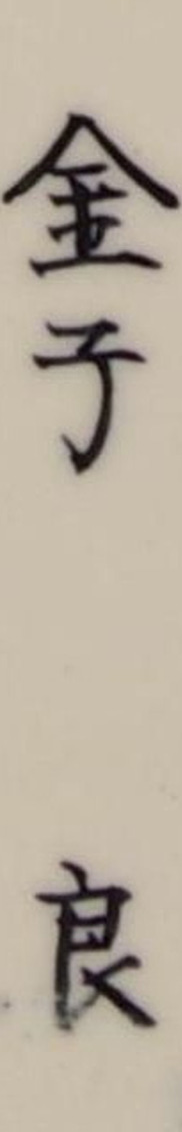金子良
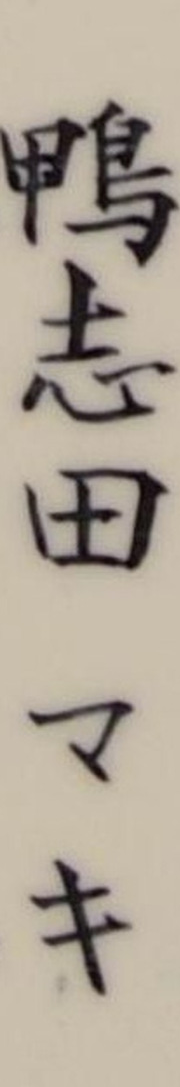鴨志田マキ
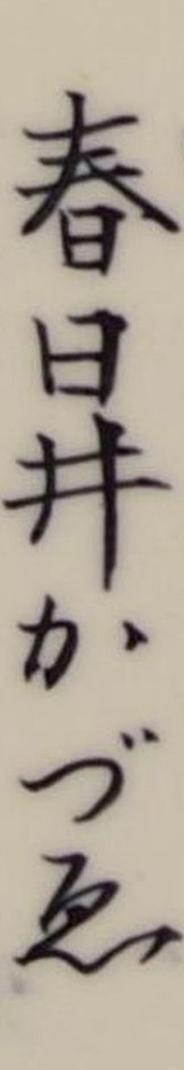春日井かづゑ
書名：M~S
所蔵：高野山金剛峯寺
